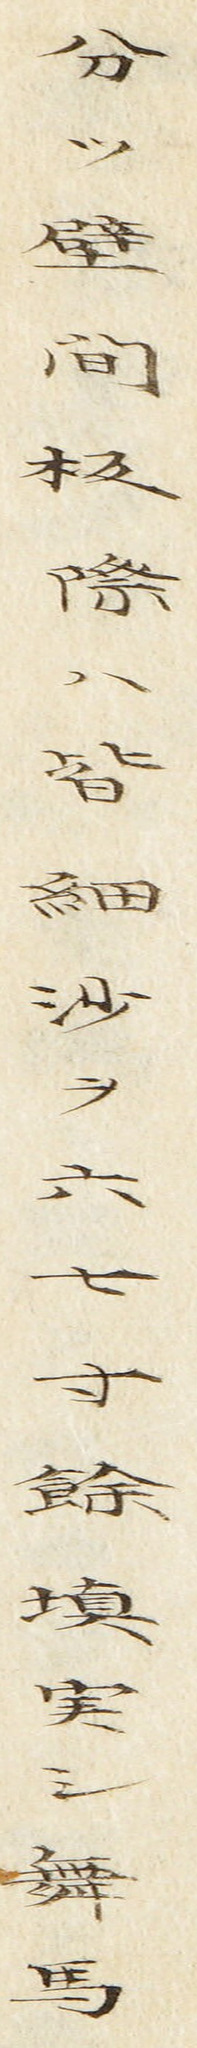分ツ壁間板際ハ皆細沙ヲ六七寸余填実シ舞馬
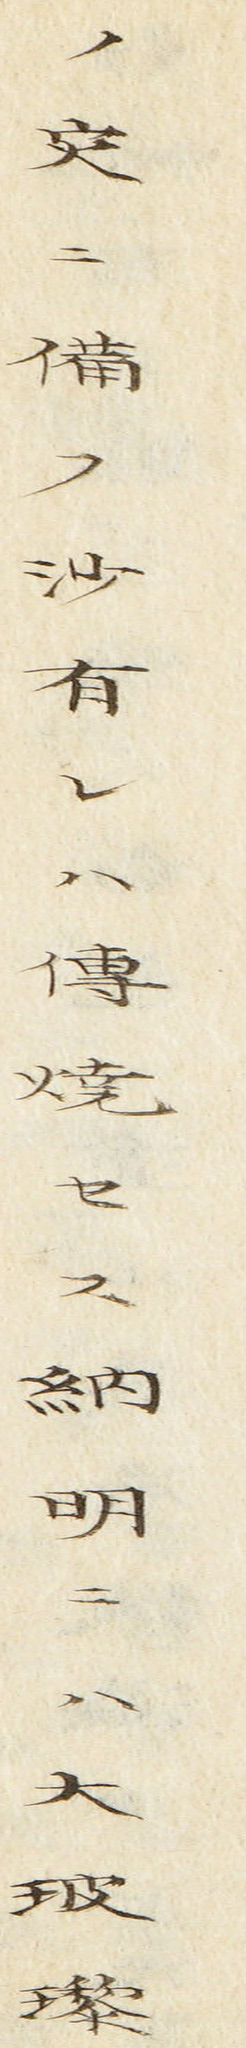ノ突ニ備フ沙有レハ伝焼セス納明ニハ大玻瓈
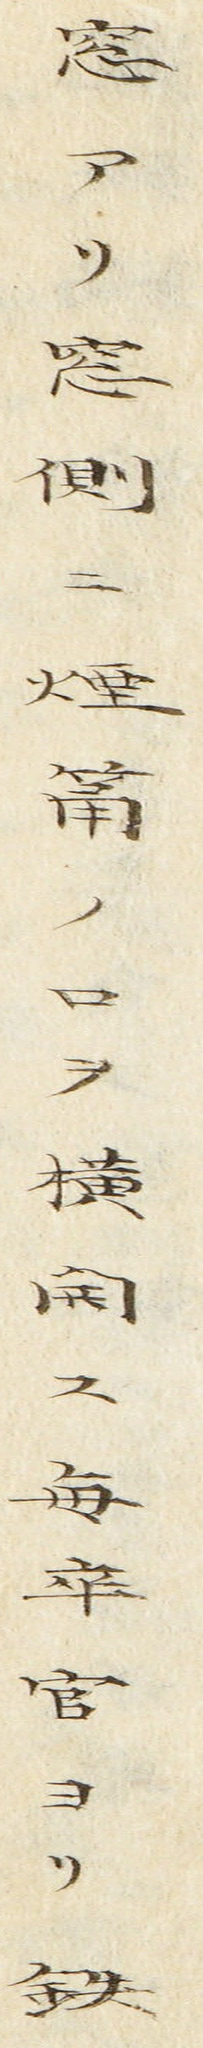窓アリ窓側ニ煙筩ノ口ヲ横開ス毎卒官ヨリ鉄

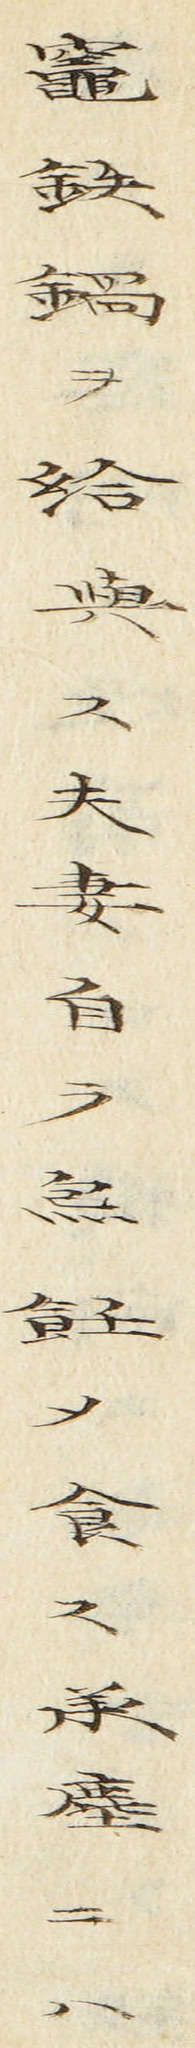竈鉄鍋ヲ給与ス夫妻自ラ炰飪シテ食ス塵ニハ
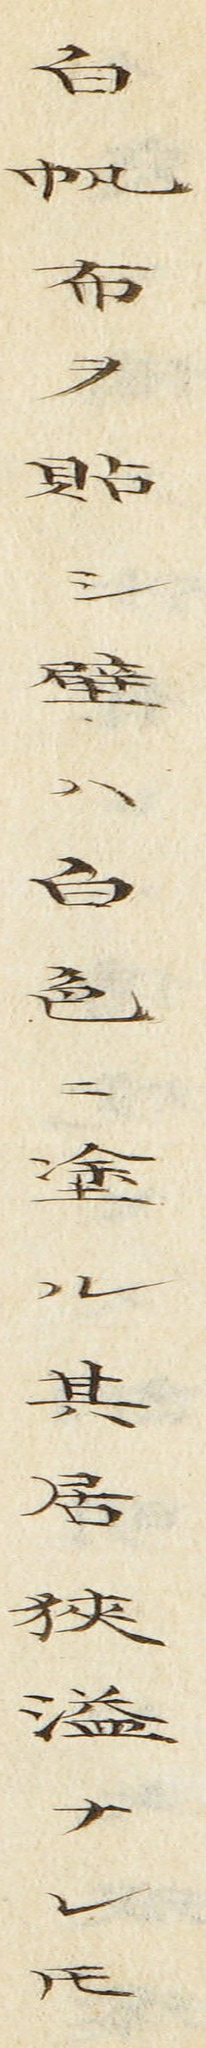白帆布ヲ貼シ壁ハ白色ニ塗ル其居狭溢ナレトモ
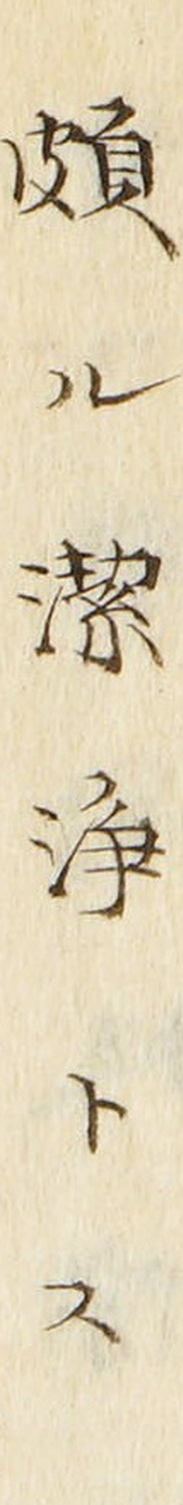頗ル潔浄トス
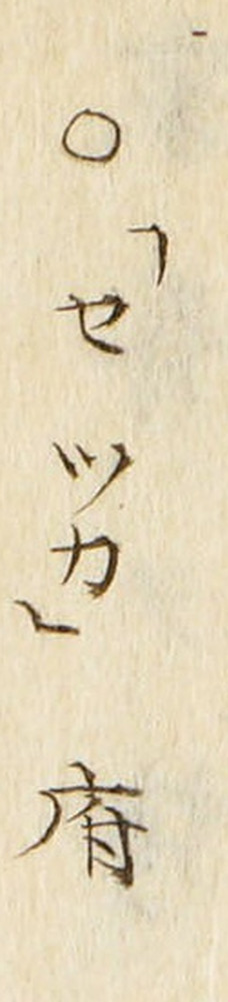「セツカ」府

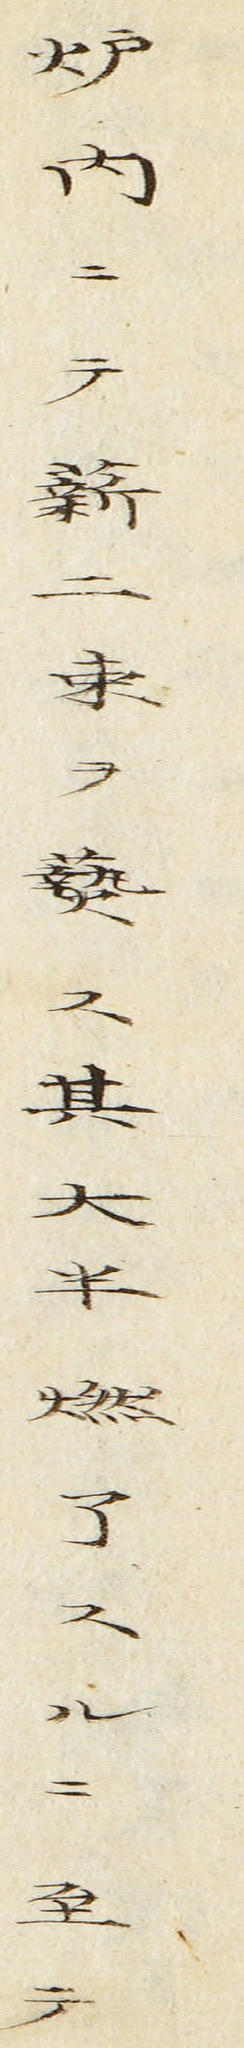炉内ニテ薪二束ヲス其大半燃了スルニ至テ
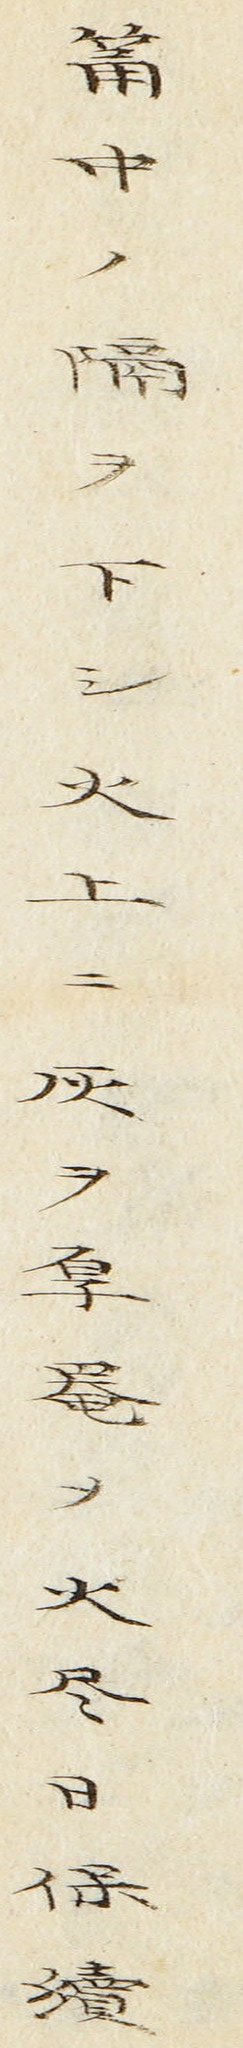筩中ノ隔ヲ下シ火上ニ灰ヲ厚罨シテ火尽日保続
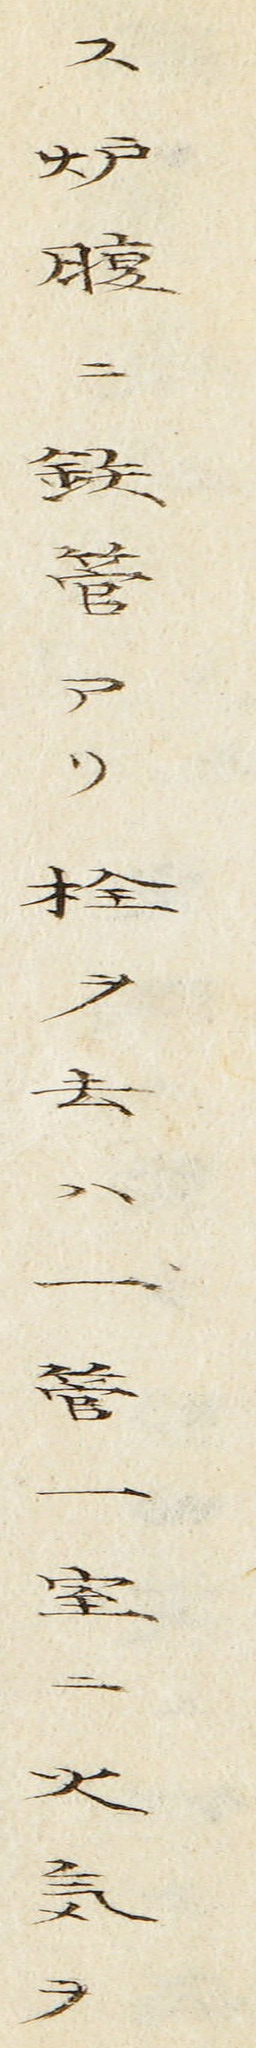ス炉腹ニ鉄管アリ栓ヲ去ハ一管一室ニ下記火気ヲ
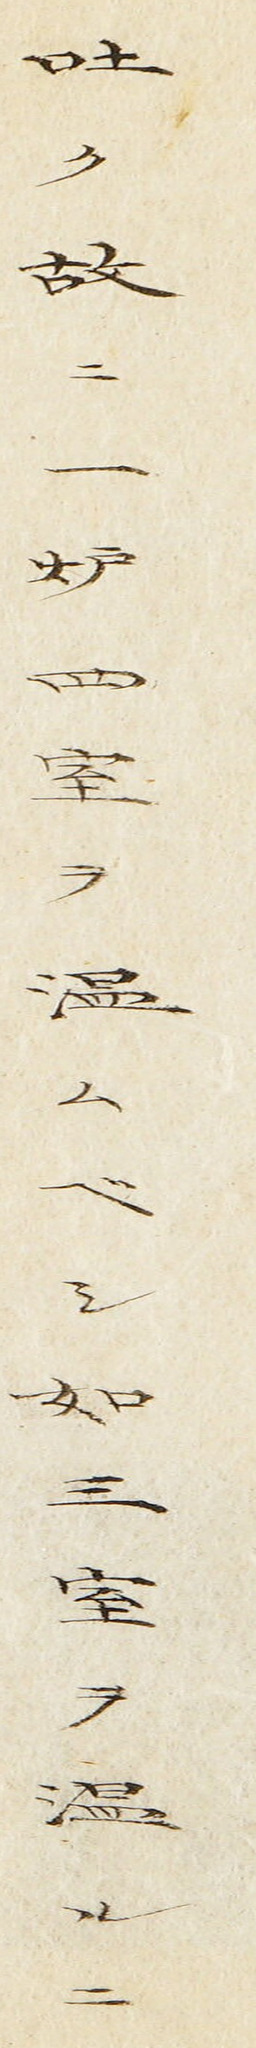吐ク故ニ一炉四室ヲ温ムベシ如三室ヲ温ルニ
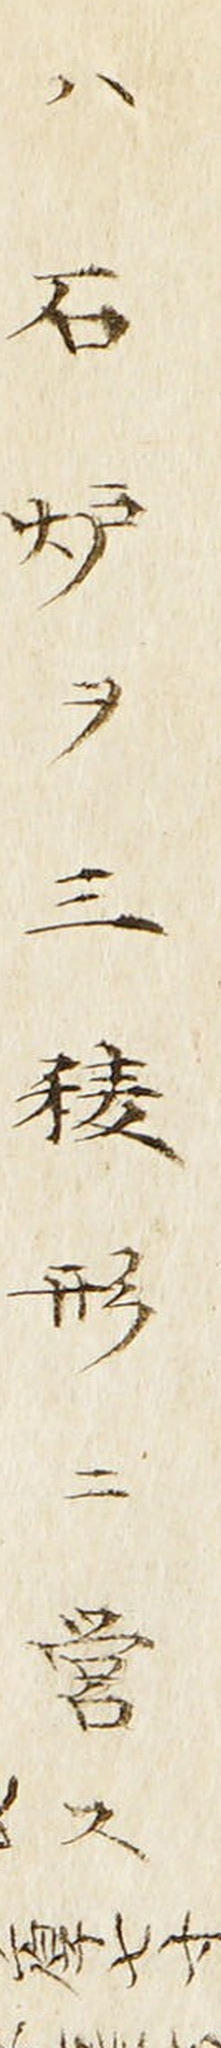ハ石炉ヲ三稜形ニ営ス
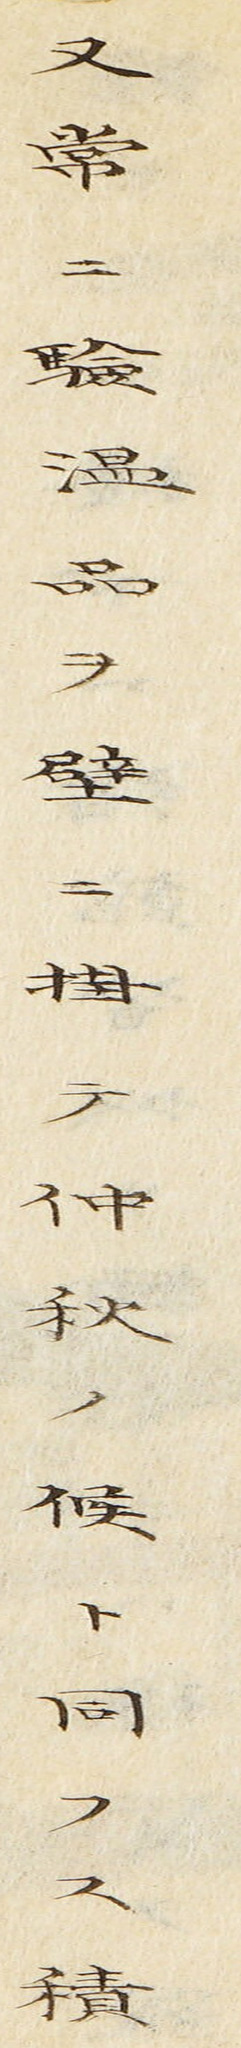〇又常ニ験温品ヲ壁ニ掛テ仲秋ノ候ト同クス積
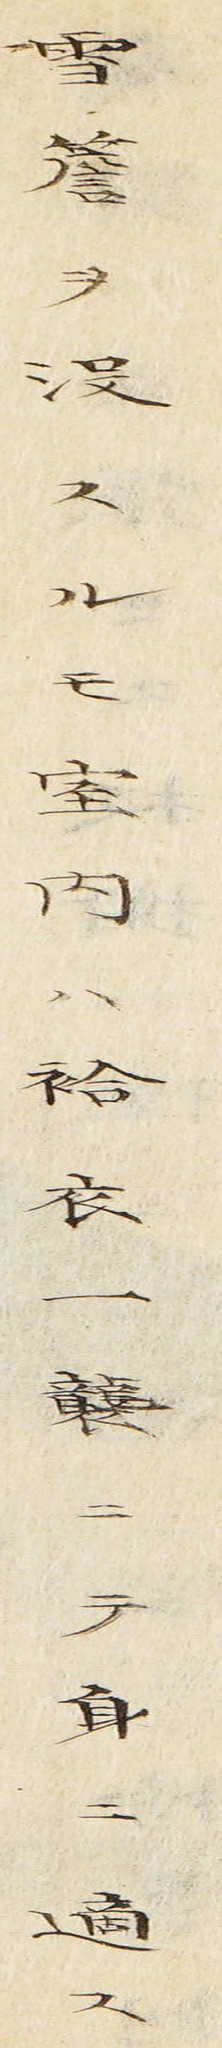雪簷ヲ没スルモ室内ハ袷衣一襲ニテ身ニ適ス
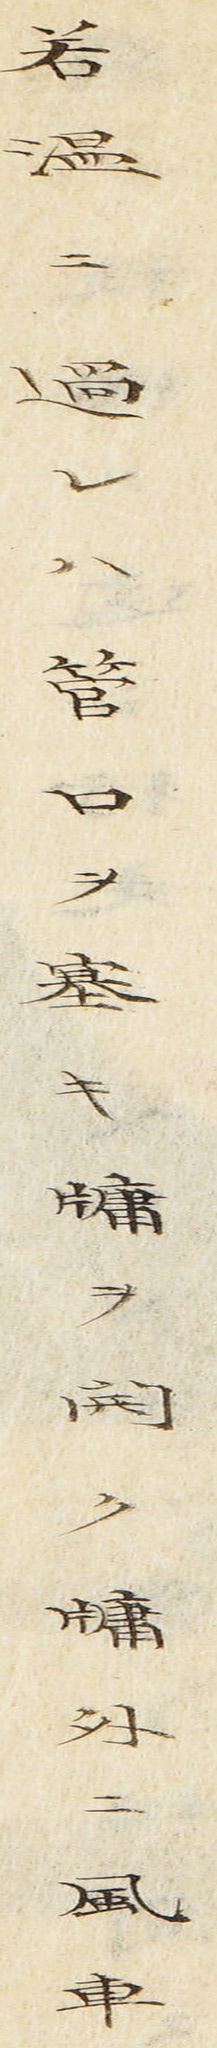若温ニ過レハ管口ヲ塞キ牅ヲ開ク牅外ニ風車
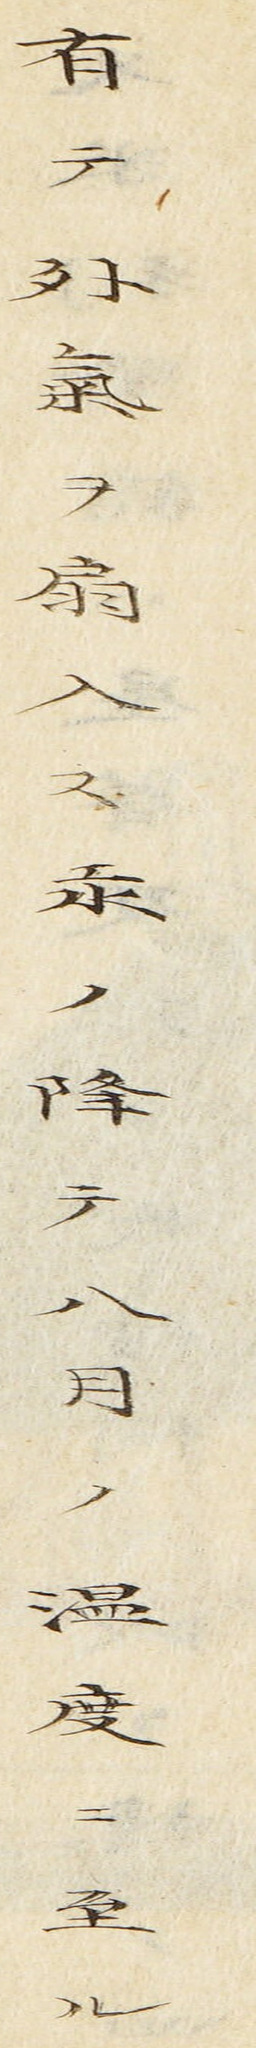有テ外気ヲ扇入ス汞ノ降テ八月ノ温度ニ至ル
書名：蕃談
